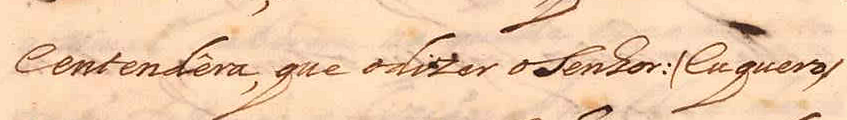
E entendêra, que o dizer o Senhor: (Eu quero)
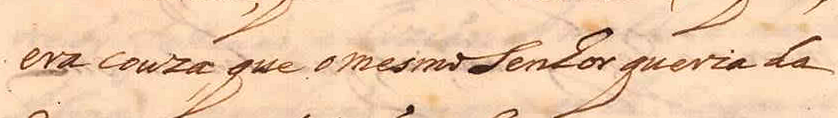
era couza, que o mesmo Senhor queria da
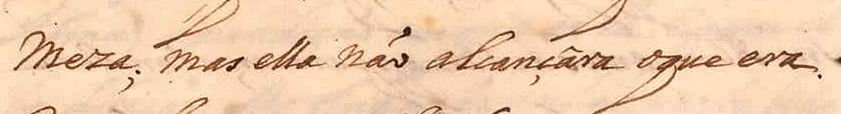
Meza, mas ella não alcançâra o que era
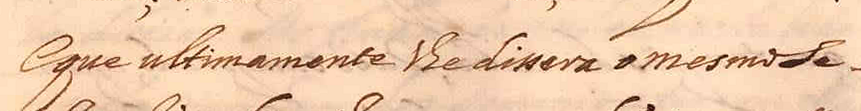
E que ultimamente lhe dissera o mesmo Se
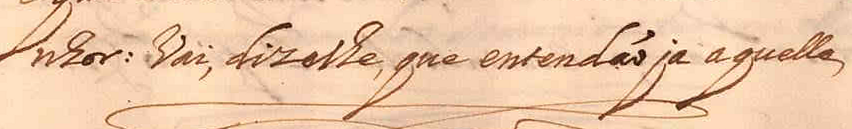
nhor: Vai, dizelhe, que entendaõ ja aquelle
